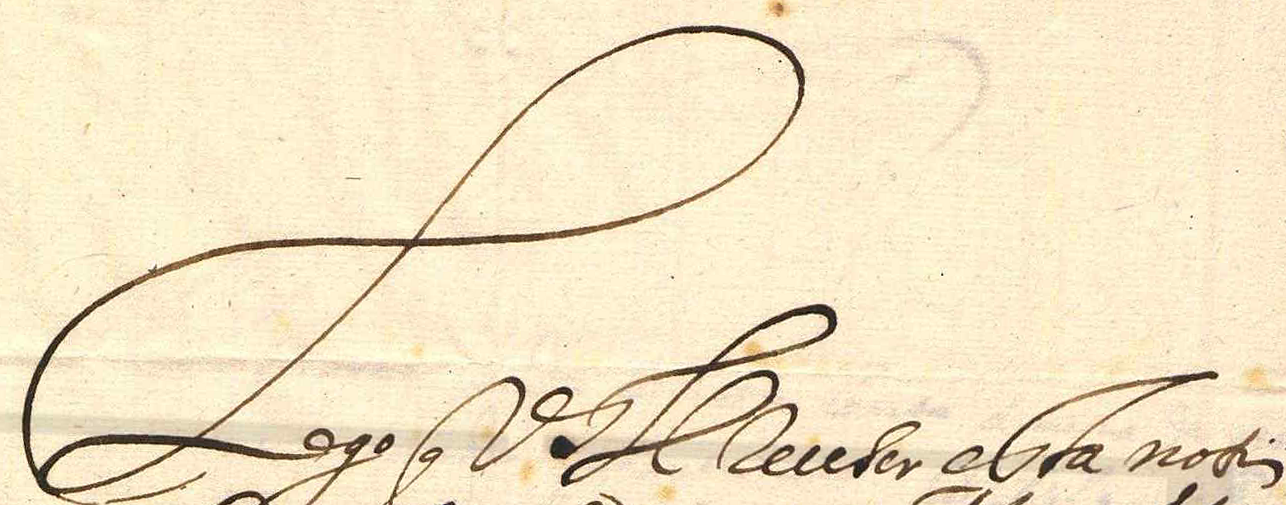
Logo q̄ V s Il Receber esta noti
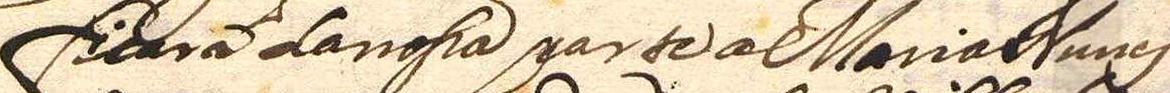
ficara da nossa parte a Maria Nunes
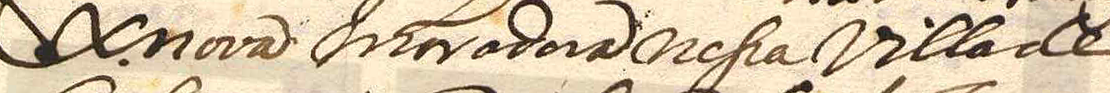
x. nova moradora nessa Villa de
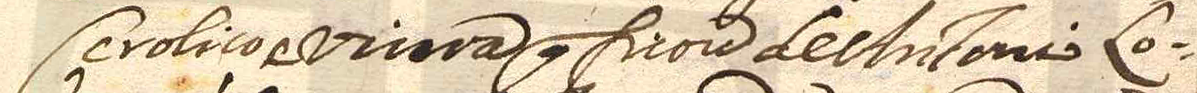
Cerolico, e viuva q̄ ficou de Antonio Lo
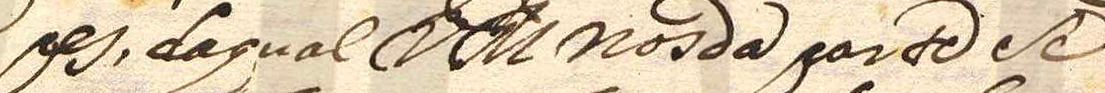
pes, da qual V M nos da parte se
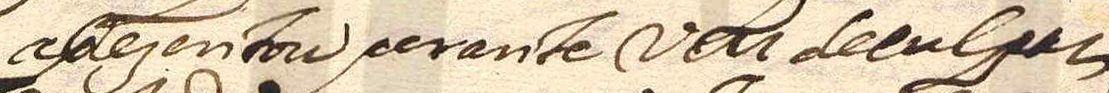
aprezentou perante V M de culpas
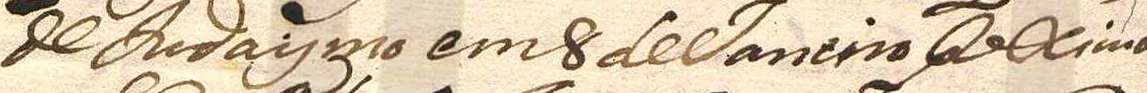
de Iudaismo em 8 de Ianeiro proximo
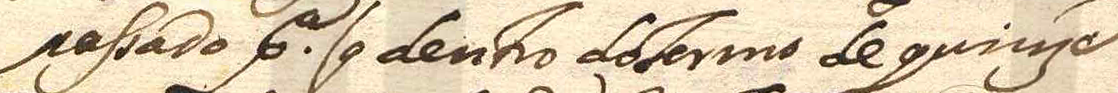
passado p.a q̄ dentro do termo de quinze
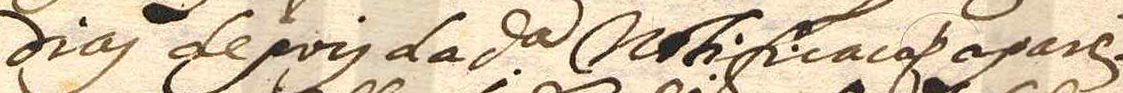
dias depois da d.a notificaçaõ apare
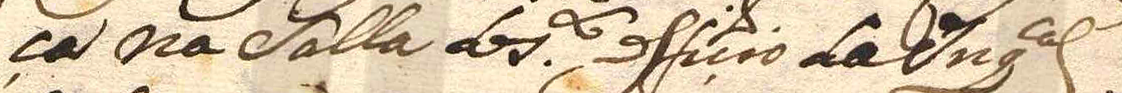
ça na salla do s.to offiçio da Inqçaõ
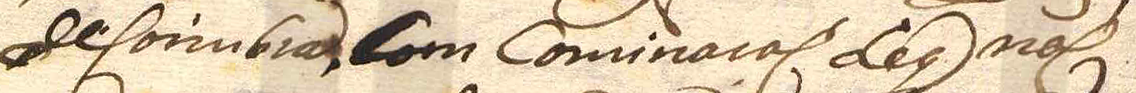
de Coimbra, com cominaçaõ de q̄ naõ
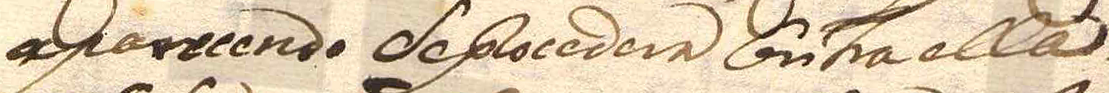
aparecendo se procedera contra ella,
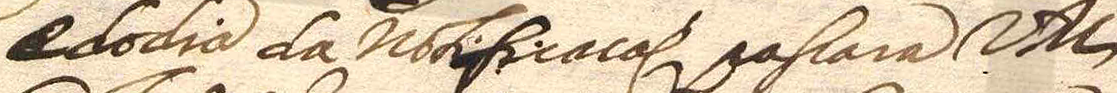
e do dia da notificaçaõ passara V M
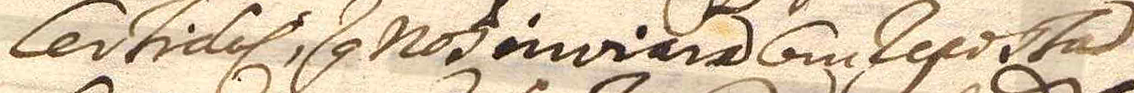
Certidaõ, q̄ nos inviara com Reposta
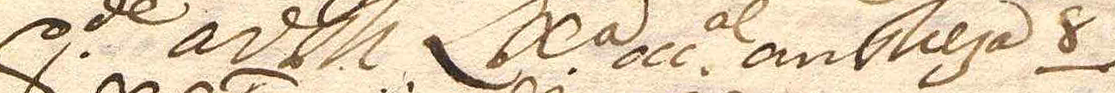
g.de a V M LX.a occ.al em Meza 8.
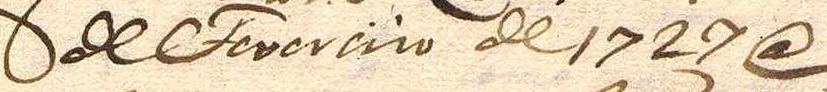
de Fevereiro de 1727 ā
